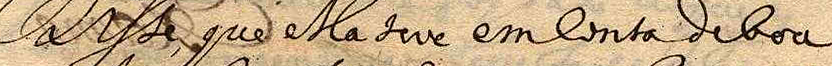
Disse, que ella teve em Conta de boa
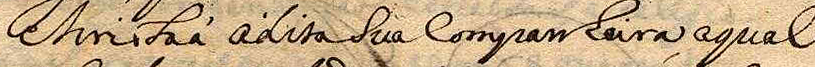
christaã a dita sua Companheira, a qual
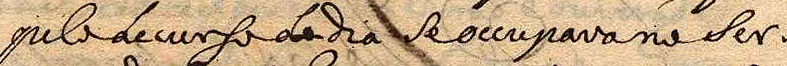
pelo decurso do dia se occupava no ser.
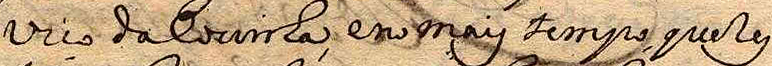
viço da Cozinha, e no mais tempo, que Res
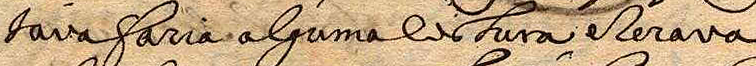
tava fazia alguma costura, e Rezava
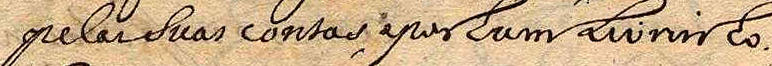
pelas Suas contas, e por hum Livrinho.
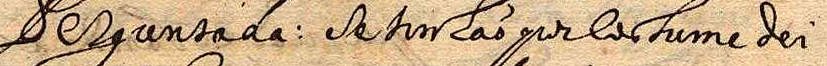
Perguntada: se tinhaõ por costume dei
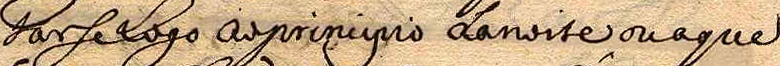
tarse Logo ao principio da noite, ou a que
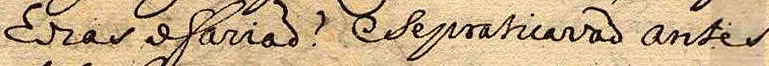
horas o faziaõ? e se praticavaõ antes
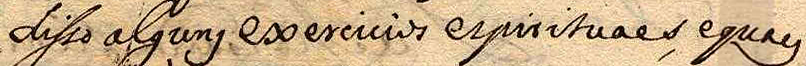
disso alguns exercicios espirituaes, e quaes
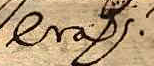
eraõ?
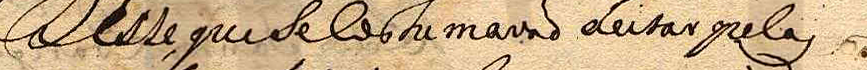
Disse, que Se costumavaõ deitar pelas
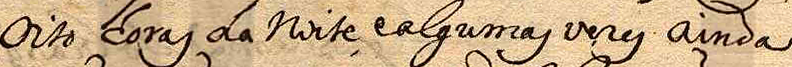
oito horas da noite, e algumas vezes ainda
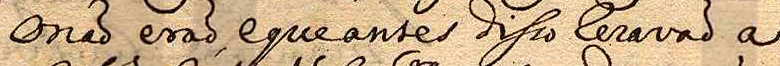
o naõ eraõ, e que antes disso Rezavaõ a
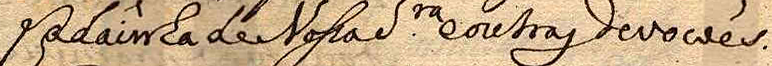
Ladainha de Nossa S.ra e outras devocoẽs.
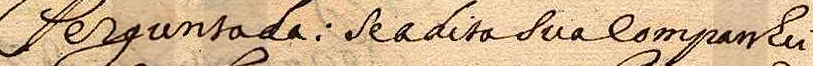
Perguntada: se a dita sua companhei
